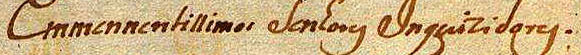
Emmennentissimos Senhores Inquizidores.
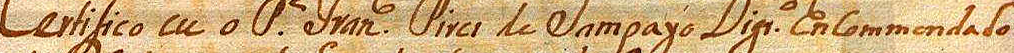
Certifico eu o P.e Fran.c Pires de Sampayo Vigr.o EnCommendado
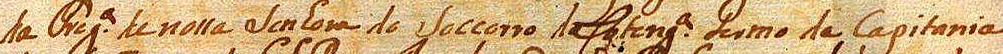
da Freg.a de nossa Senhora de Soccorro de Cateng.a termo da Capitania
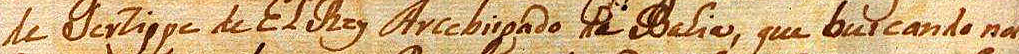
de SerZippe de EL Rey Arcebispado da Bahia, que buscando nos
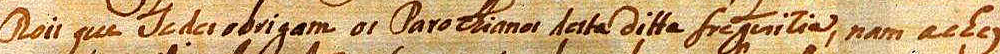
Rois que se desobrigam os Parochianos desta ditta fregueZia, nam achey
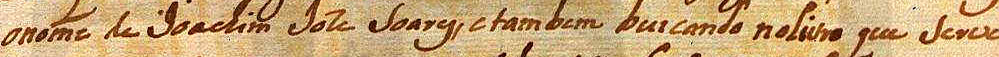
o nome de Ioachim IoZe Soares, e tambem buscando no Livro que serve
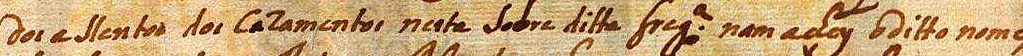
dos assentos dos caZamentos nesta Sobreditta freg.a nam achey o dito nome.
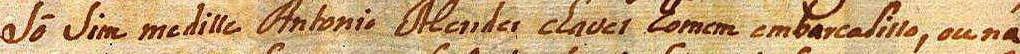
Só Sim me disse Antonio Mendes chaves homem embarcadisso, ou na
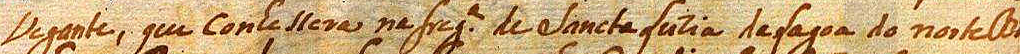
Vegante, que conhessera na freg.a de Sancta LuZia da Lagoa do norte Bi
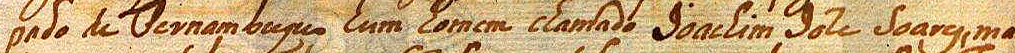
pado de Pernambuquo hum homem chamado Ioachim IoZe Soares, ma
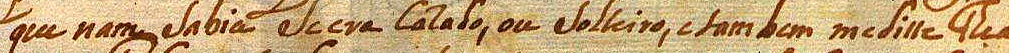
que nam Sabia Se era CaZado, ou SoLteiro, e tambem me disse Tea
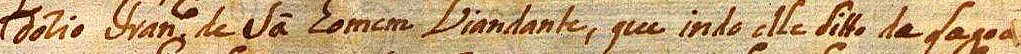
doZio Fran.co de Sá homem Viandante, que indo elle ditto da Lagoa
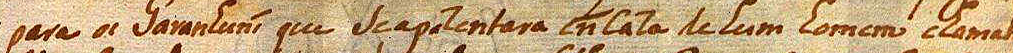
para as Paranhun̄s que se apaZentara en CaZa de hum homem chama_
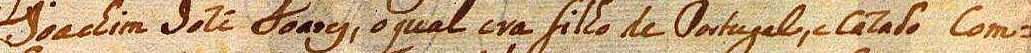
Ioachim IoZé Soares, o qual era filho de Portugal, e CaZado Com
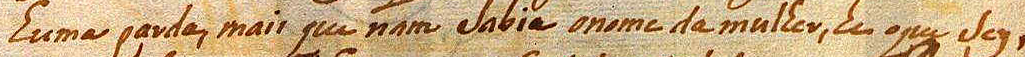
huma parda, mais que nam Sabia o nome da mulher, he o que Sey,
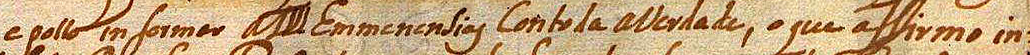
e posso informar a VV Emmenensias Contoda a Verdade, e que affirmo in
